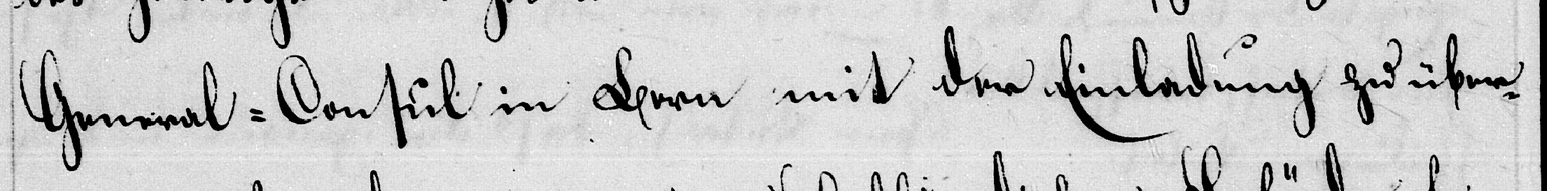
General-Consul in Bern mit der Einladung zu über¬
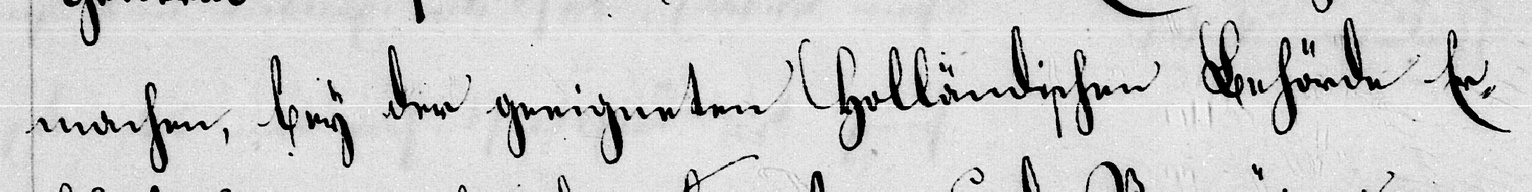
machen, bey der geeigneten Holländischen Behörde Er¬
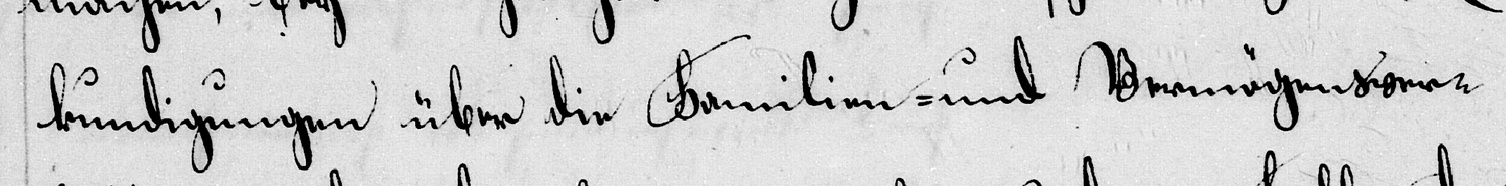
kundigungen über die Familien- und Vermögensver¬
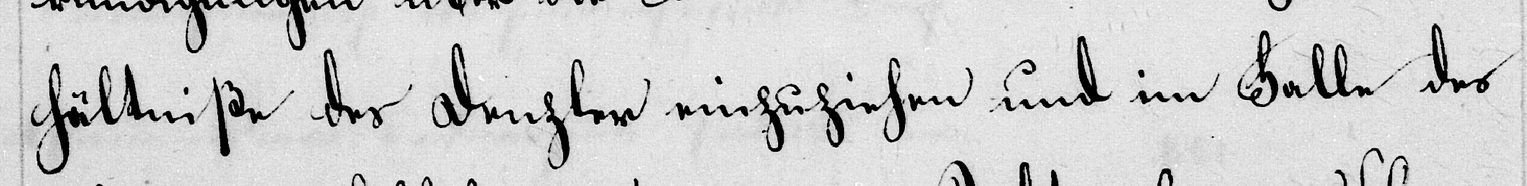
hältniße des Denzler einzuziehen und im Falle des
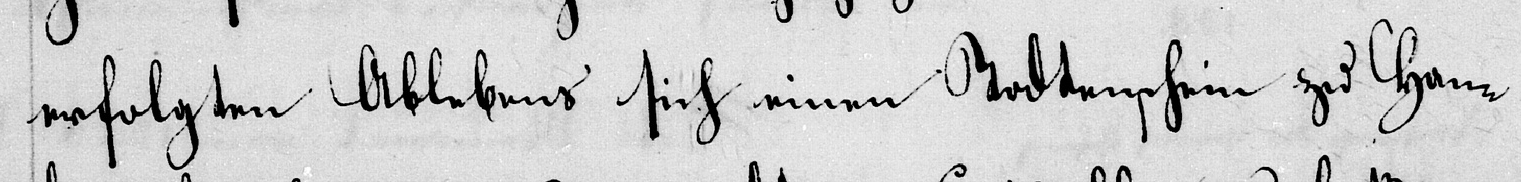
erfolgten Ablebens sich einen Todtenschein zu Han¬
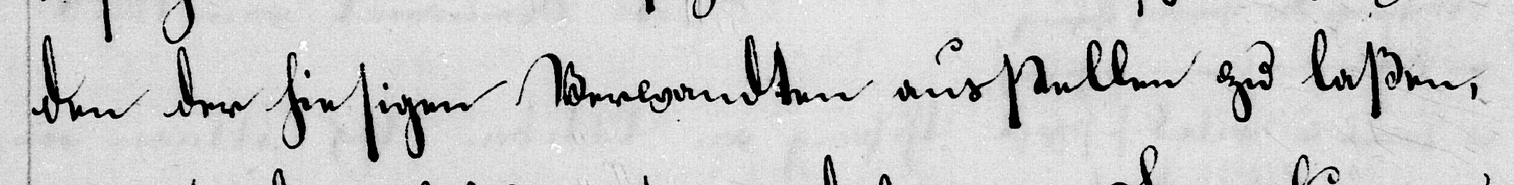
den der hiesigen Verwandten ausstellen zu laßen,
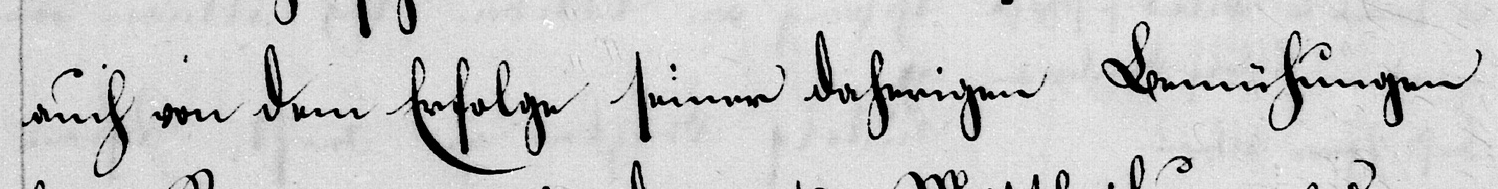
auch von dem Erfolge seiner daherigen Bemühungen
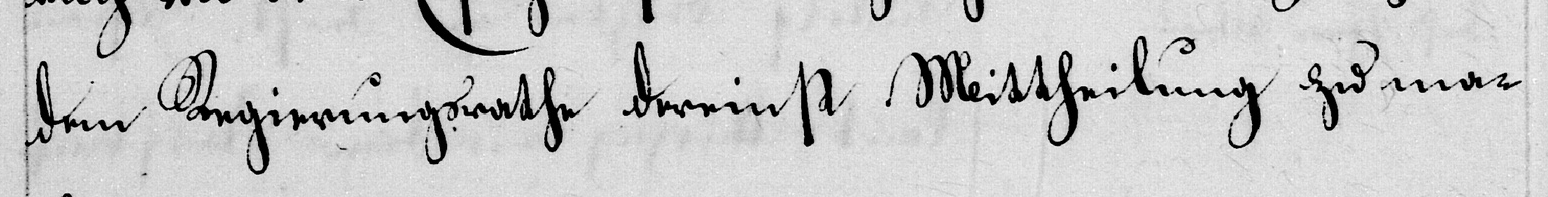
dem Regierungsrathe dereinst Mittheilung zu ma¬
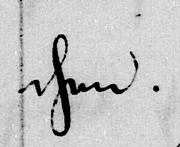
chen.
